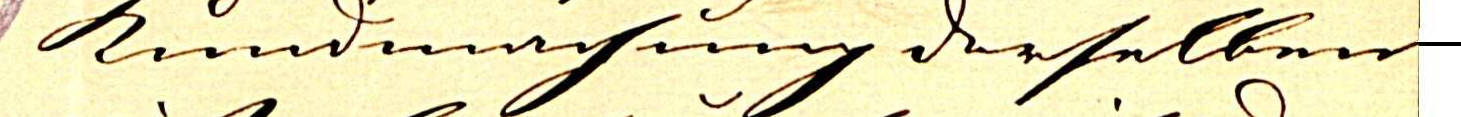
Kundmachung derselben
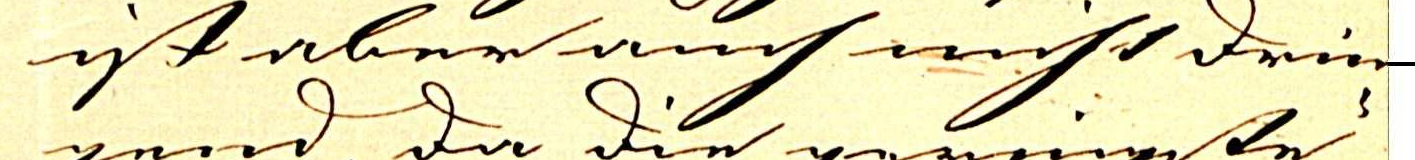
ist aber auch nicht drin¬
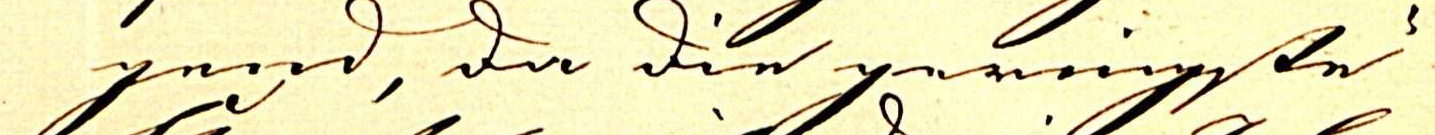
gend, da die geringste
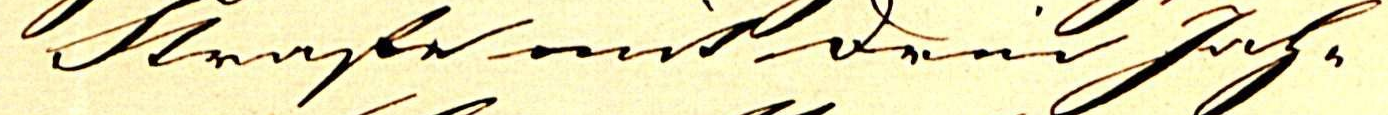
Strafe mit drei Jah¬
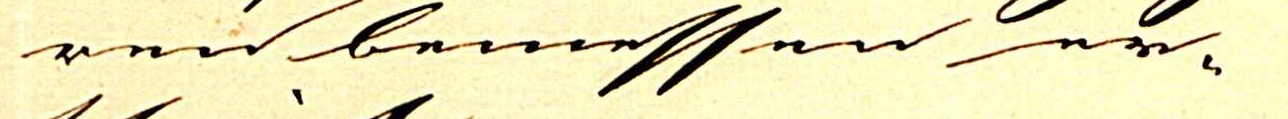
ren bemessen er¬
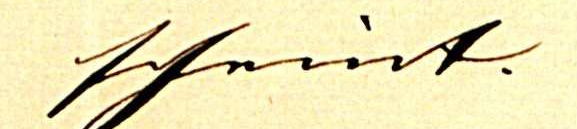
scheint.
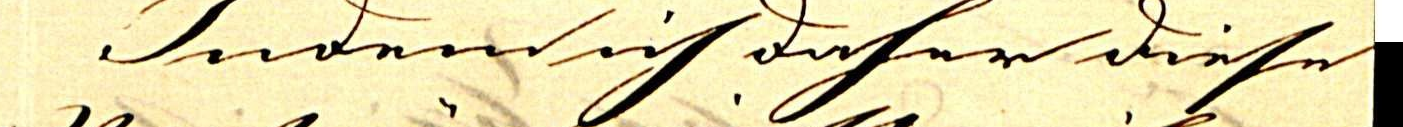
Indem ich daher diese
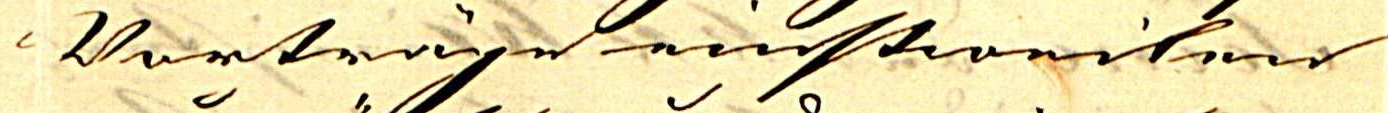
Vorträge einstweilen
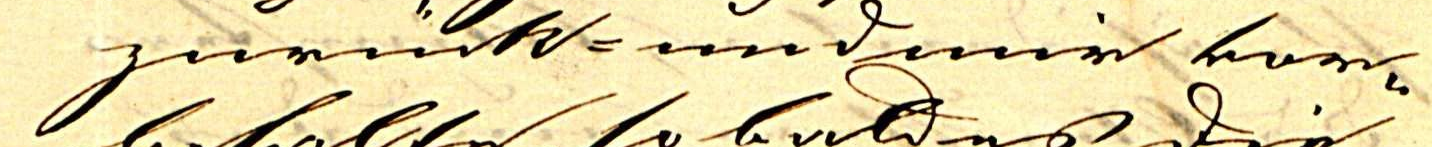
zurück- und mir vor¬
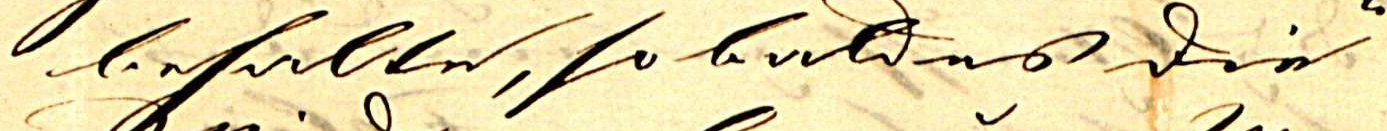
behalte, so baldes die
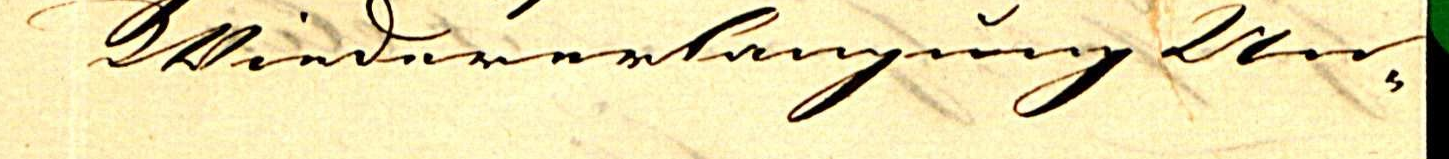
Wiedererlangung Un¬
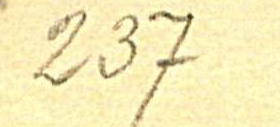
237
